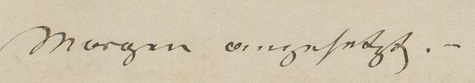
Morgen angesetzt. –
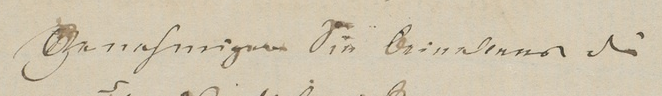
Genehmigen Sie beinebens die
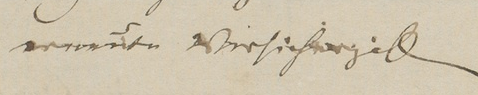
erneute Versicherg etc
